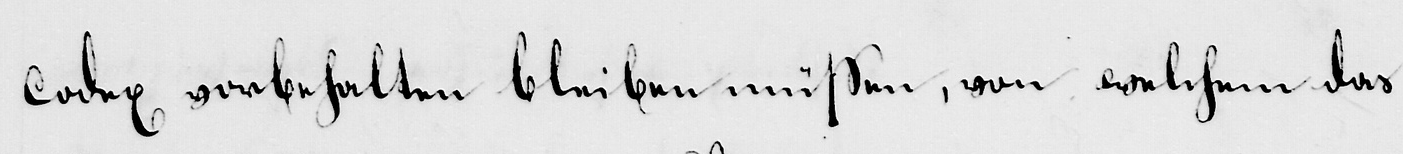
Codex vorbehalten bleiben müssen, von welchem das
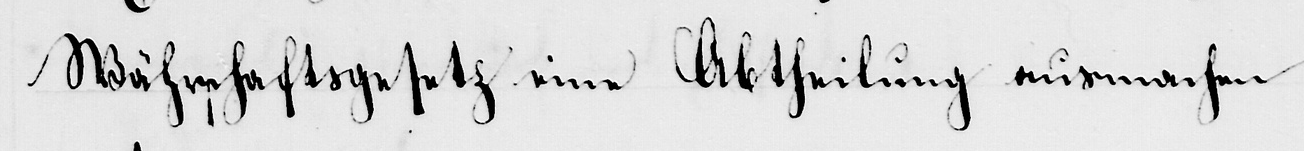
Währschaftsgesetz eine Abtheilung ausmachen
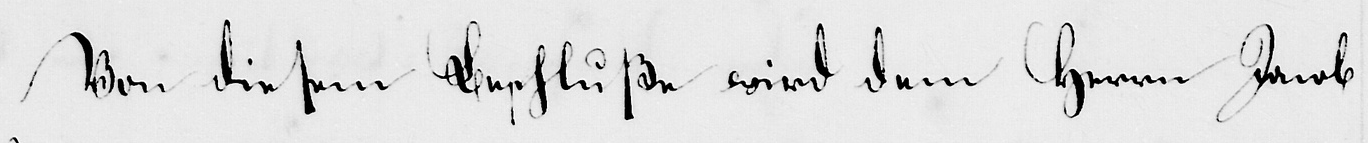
Von diesem Beschluße wird dem Herrn Jacob
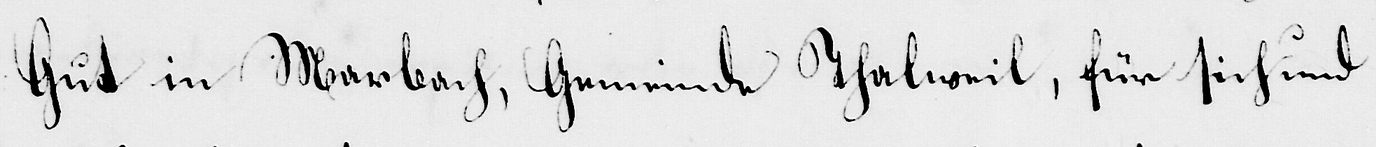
Gut in Marbach, Gemeinde Thalweil, für sich und
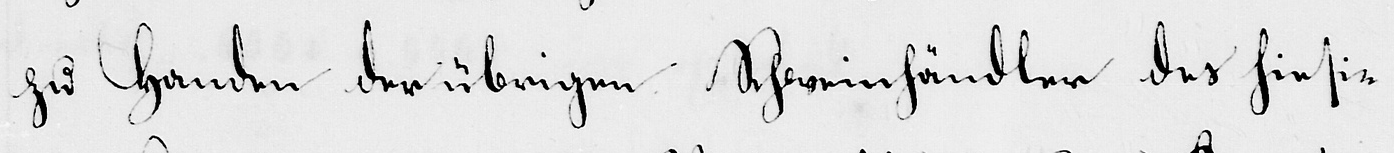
zu Handen der übrigen Schweinhändler des hiesi¬
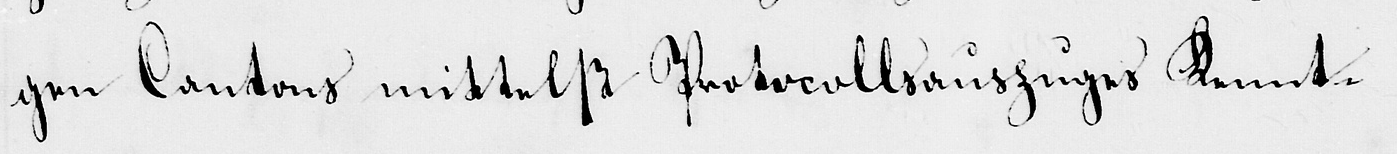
gen Cantons mittelst Protocollsauszuges Kennt¬
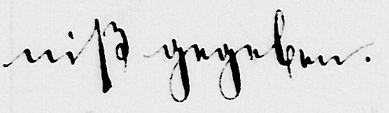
niß gegeben.
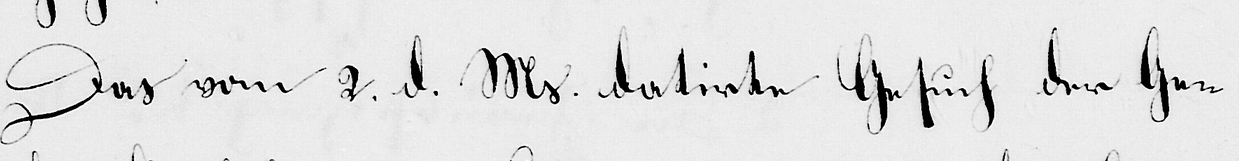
Das vom 2. d. Ms. datirte Gesuch der Gem¬
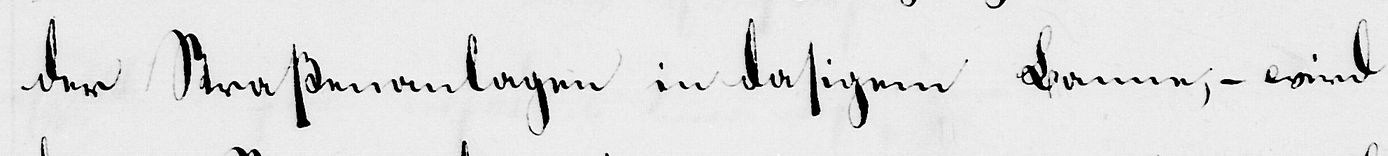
der Straßenanlagen in dasigem Banne, - wird
